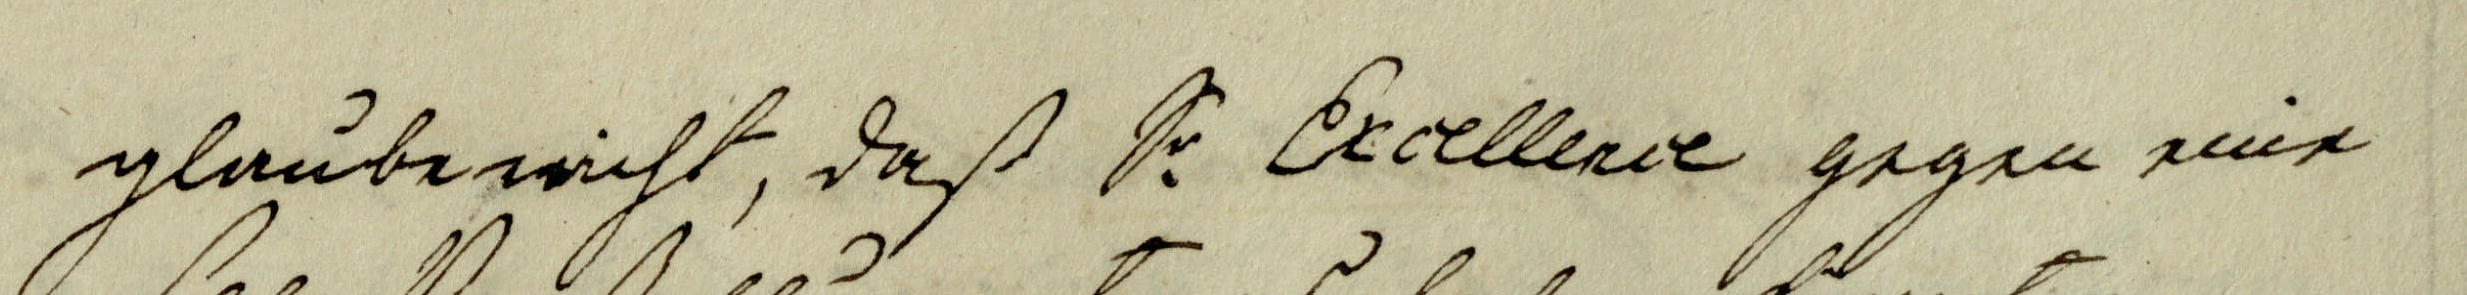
glaube nicht, daß Sr Excellence gegen eine
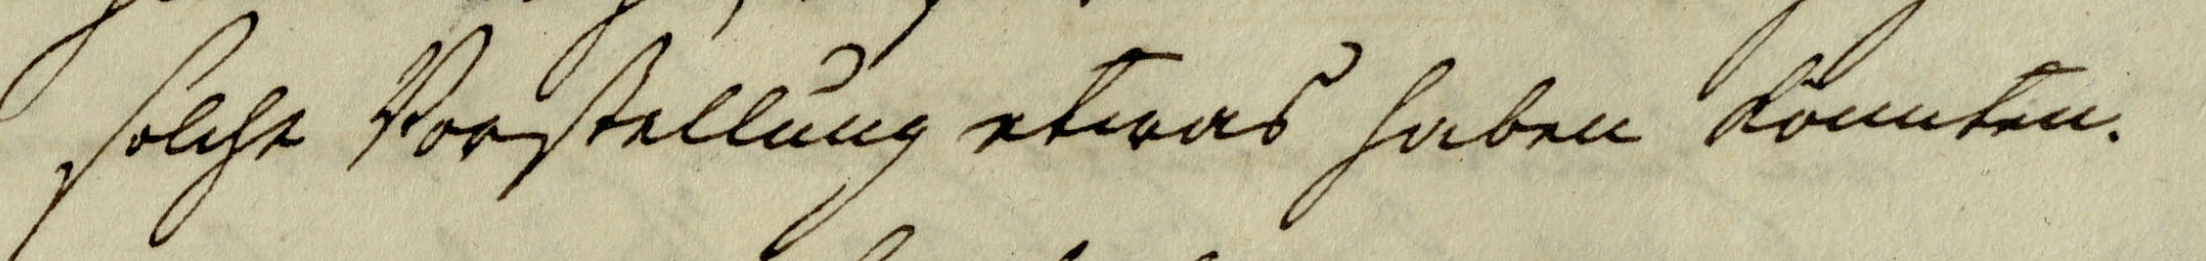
solche Vorstellung etwas haben könnten.
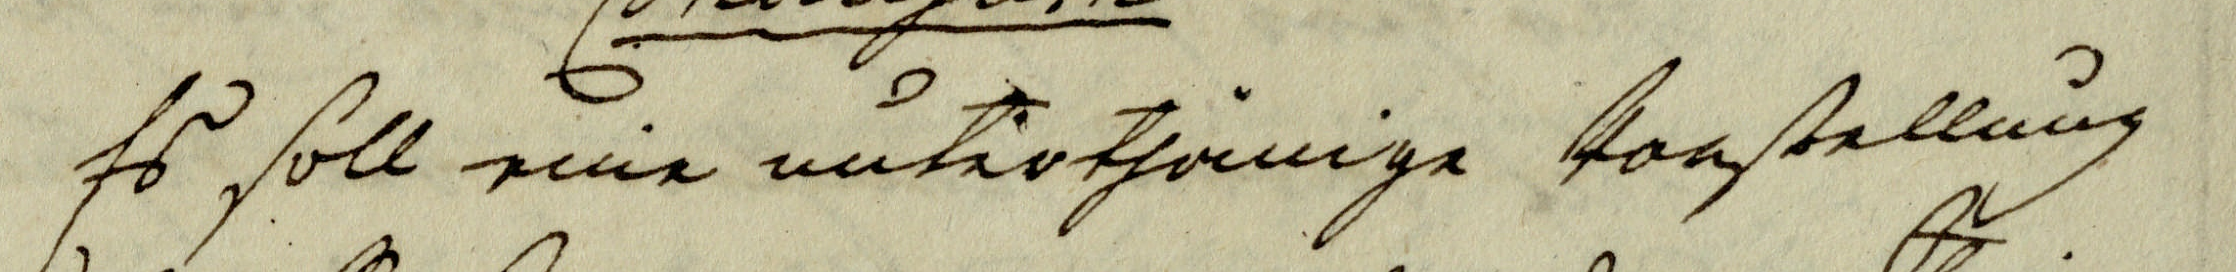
Es soll eine unterthänige Vorstellung
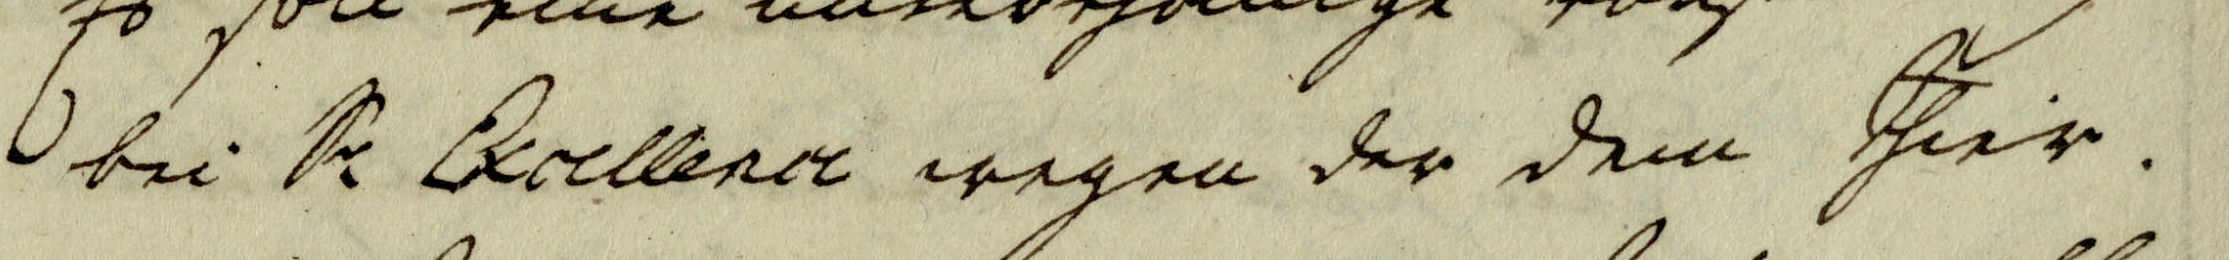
bei Sr Excellence wegen der dem Thier¬
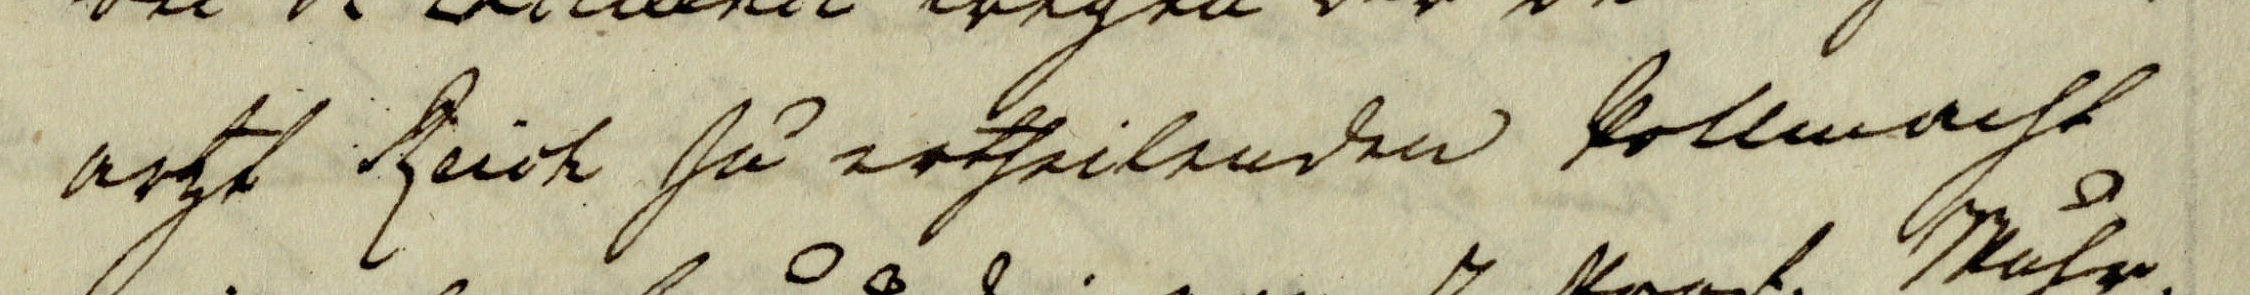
artzt Reich zu ertheilenden Vollmacht
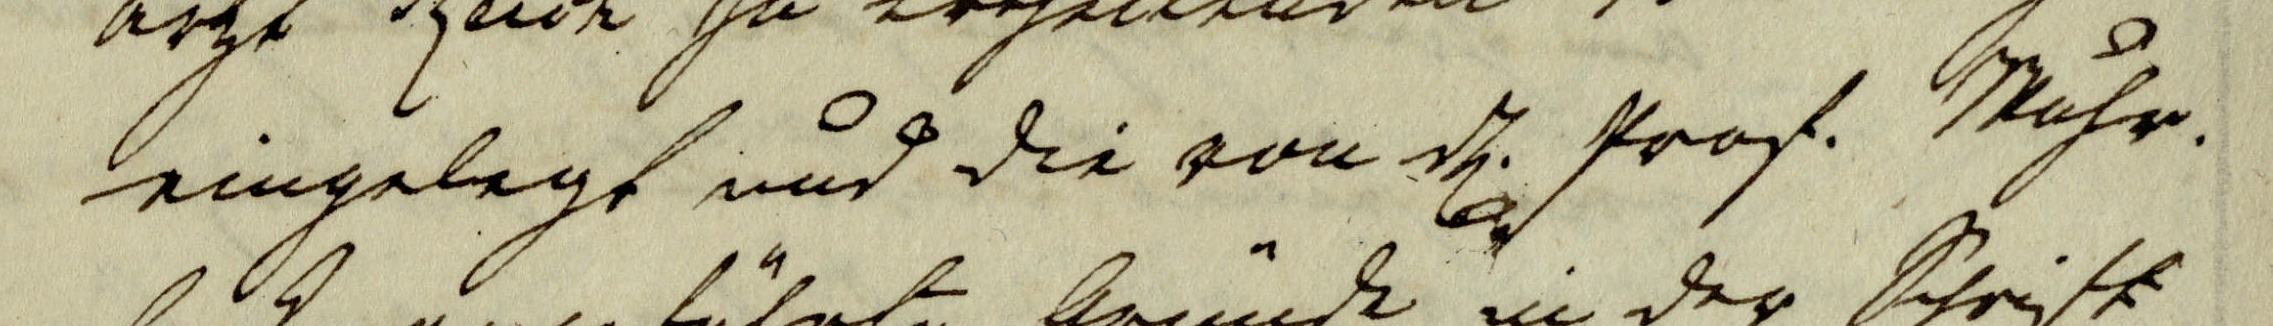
eingelegt und die von dh. Prof. Muhr¬
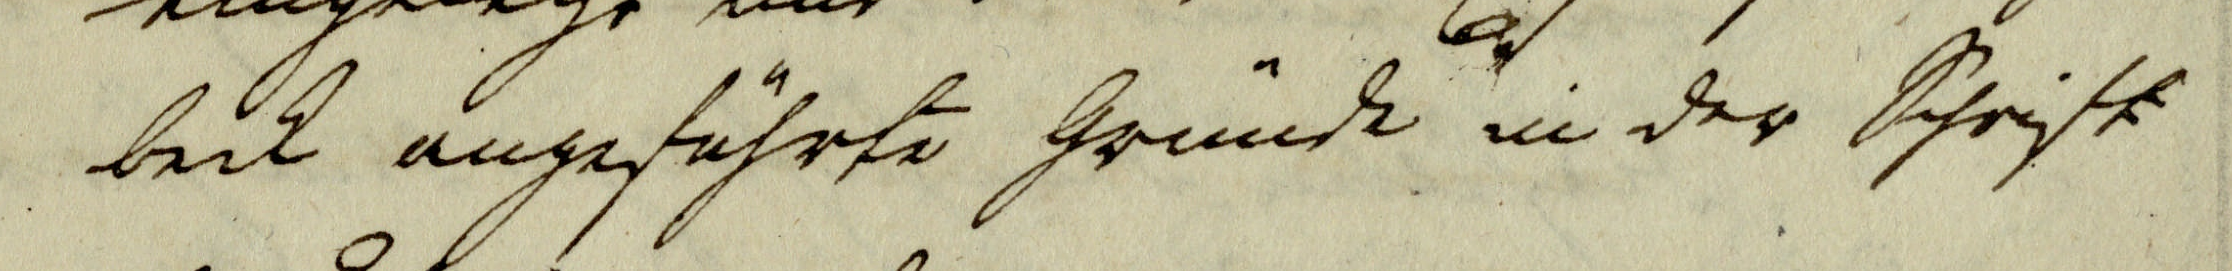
beck angeführte Gründe in der Schrift
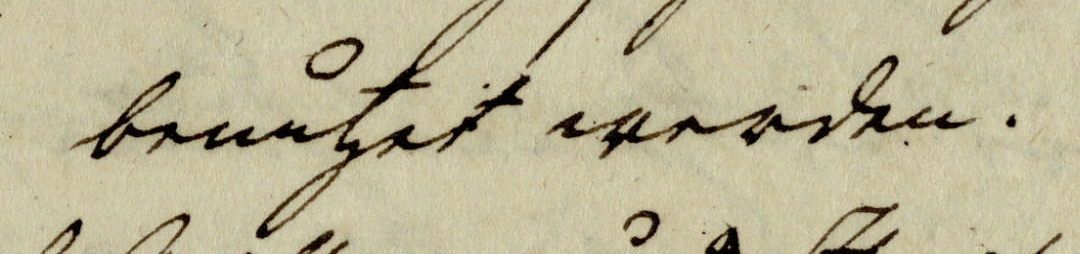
benutzet werden.
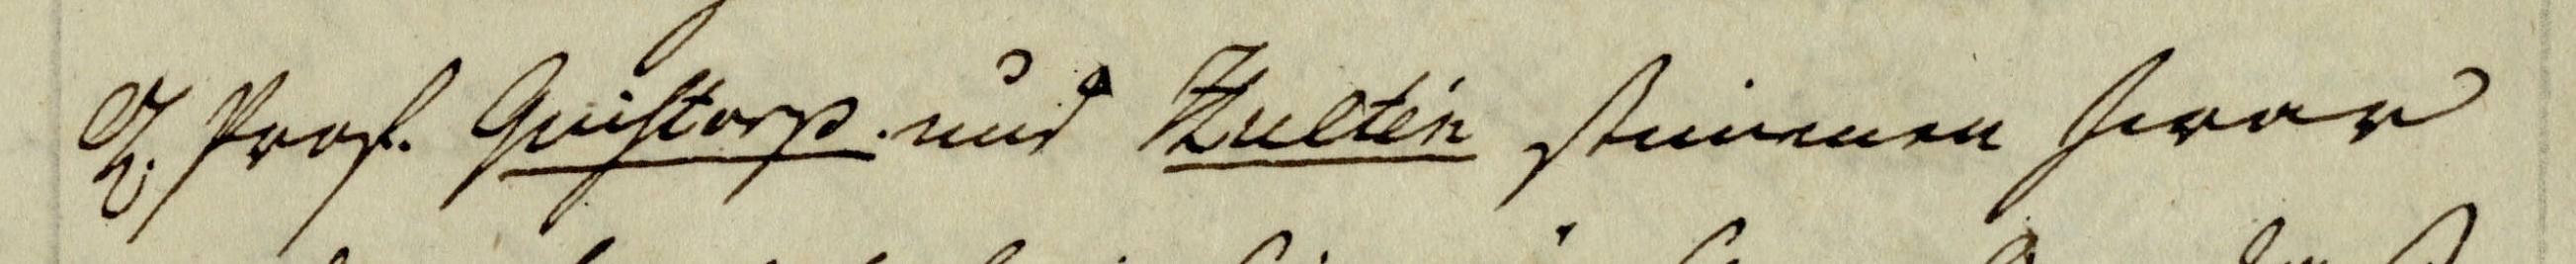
dh. Prof. Quistorp und Hultén stimmen zwar
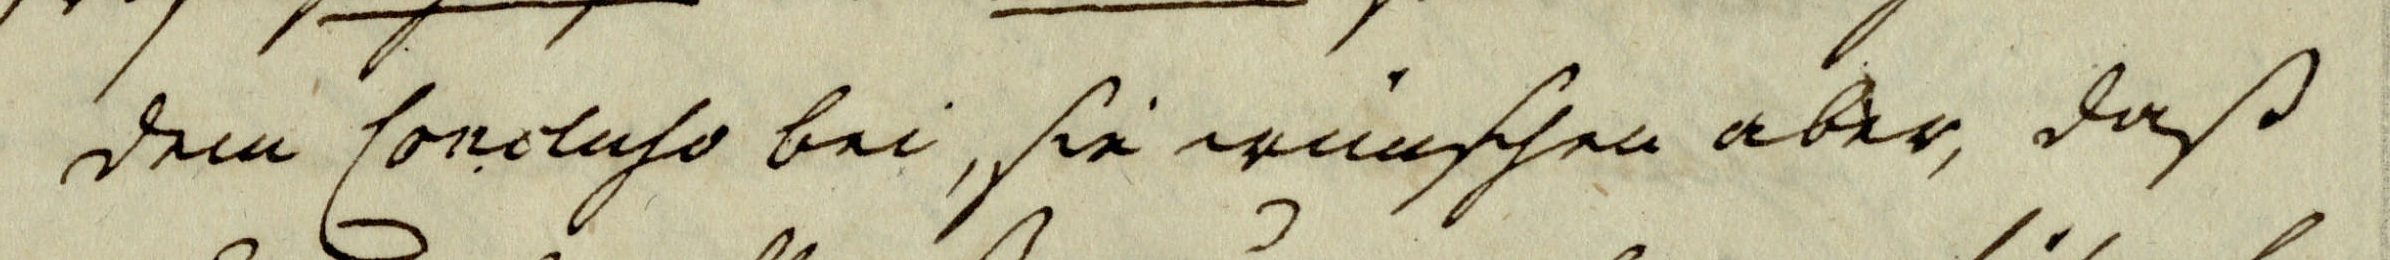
dem Concluso bei, sie wünschen aber, daß
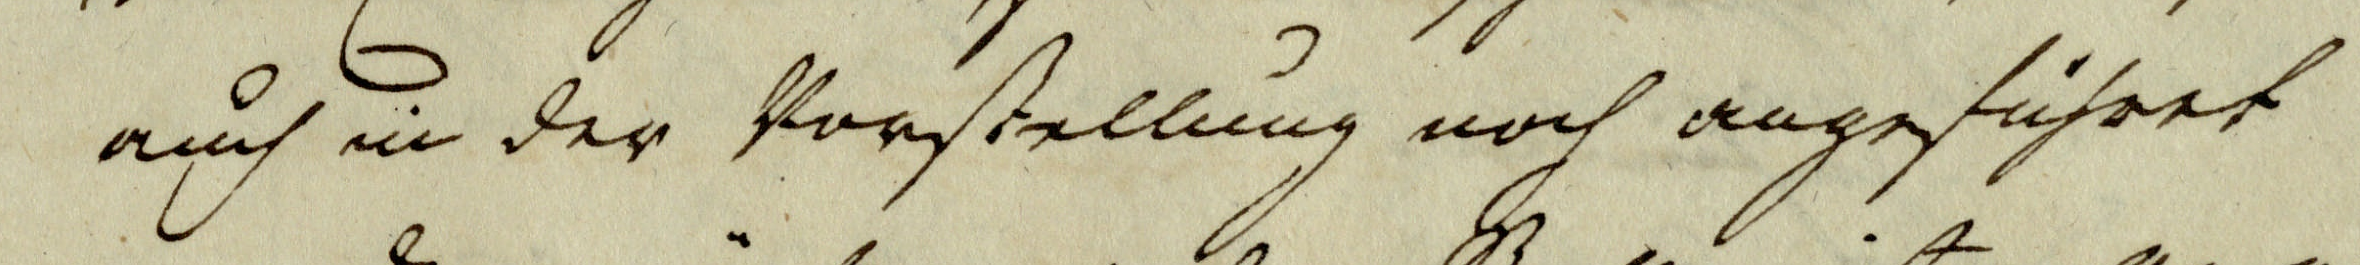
auch in der Vorstellung noch angeführet
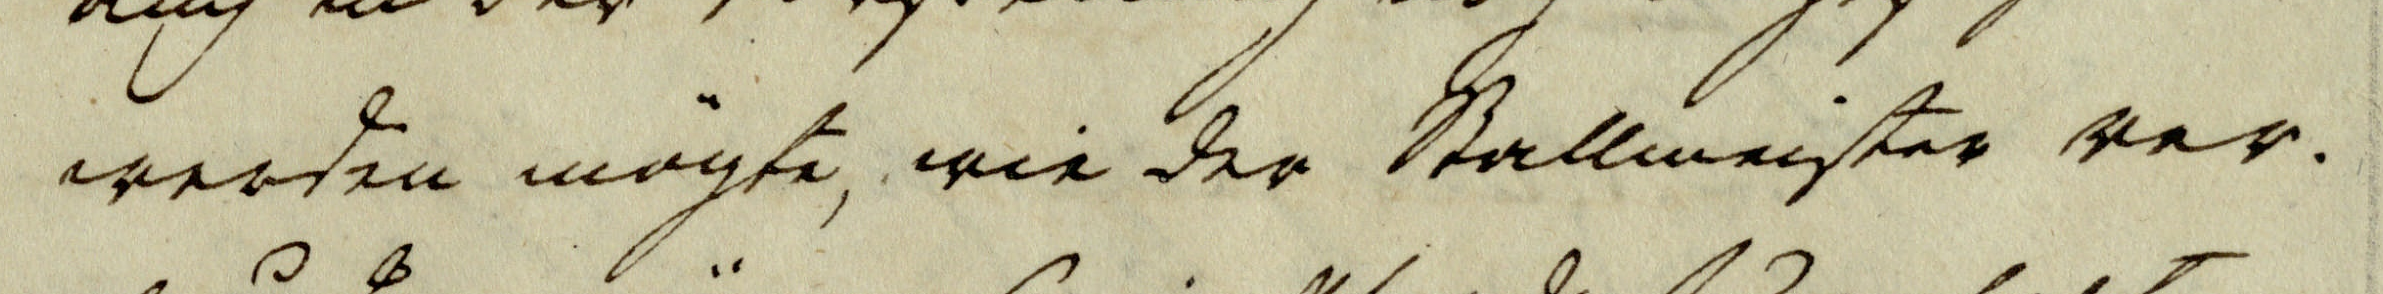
werden mögte, wie der Stallmeister ver¬
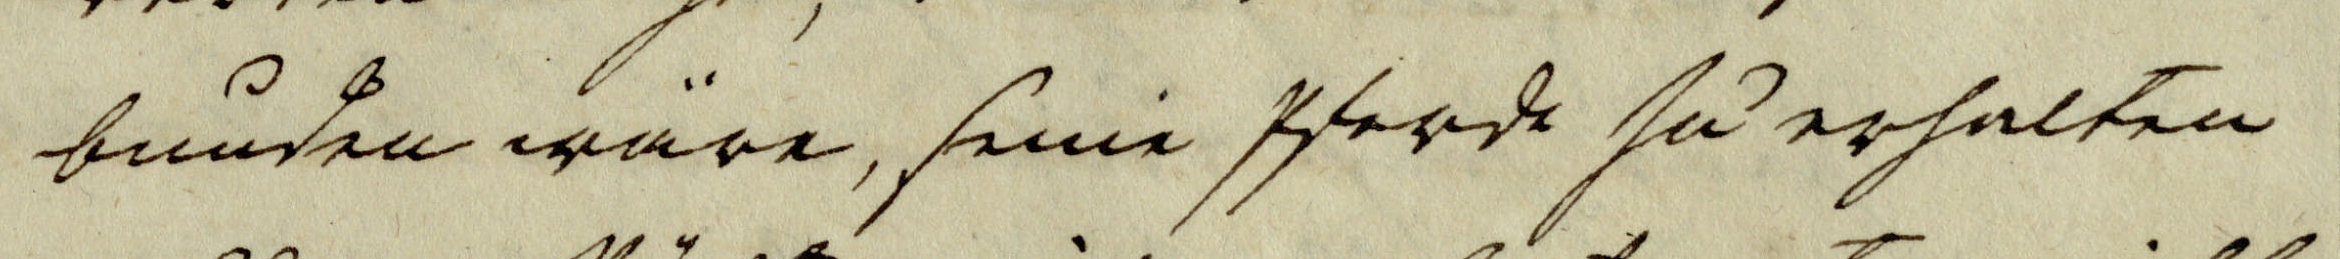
bunden wäre, seine Pferde zu erhalten
